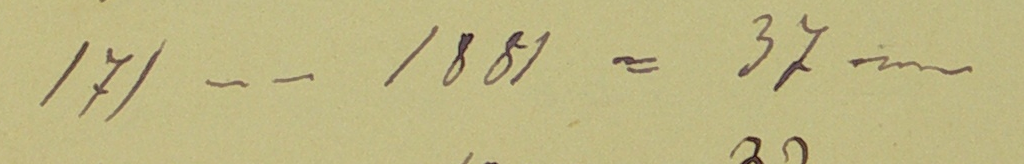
17) * 1881 = 37 mal
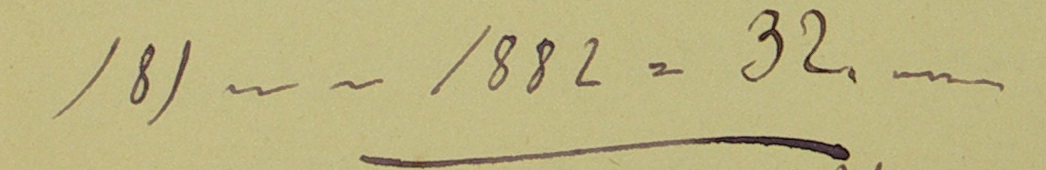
18) * 1882 = 32 mal
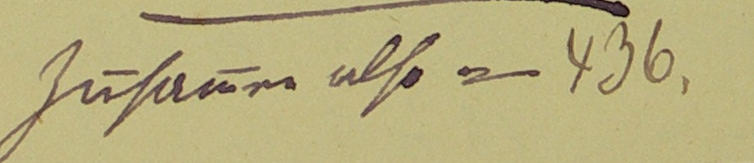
Zusammen also = 436
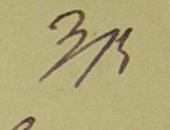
31
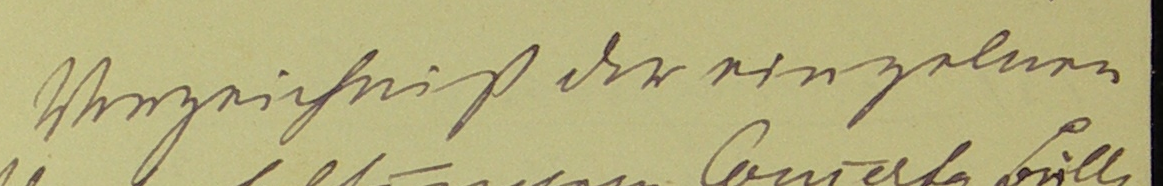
Verzeichniß der einzelnen
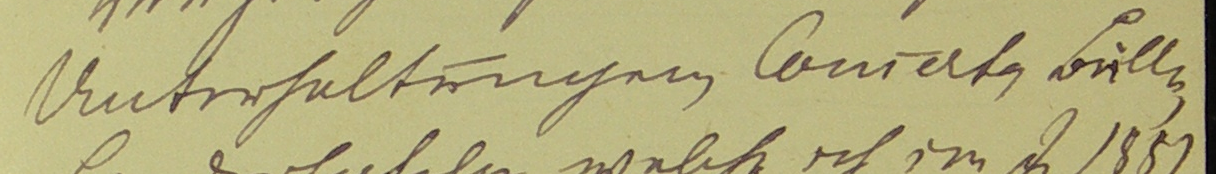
Unterhaltungen, Concerte, Bälle,
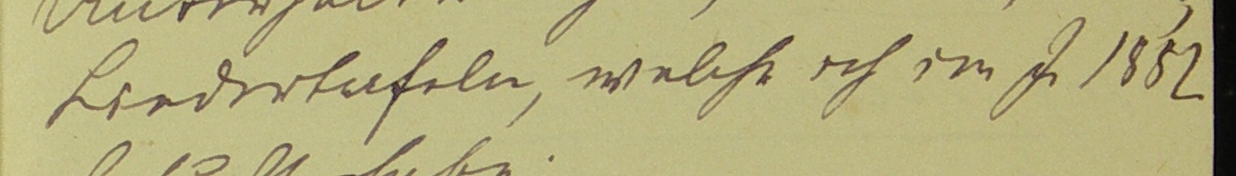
Liederabende welche ich im Jahre 1882
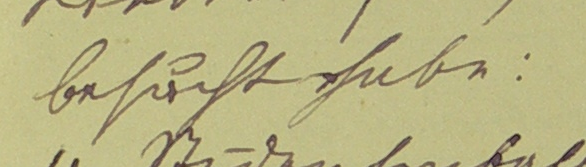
besucht habe:
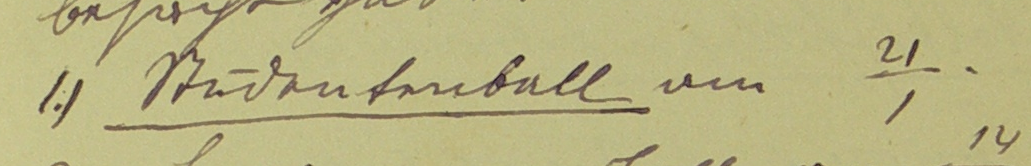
1.) Studentenball am 21/1
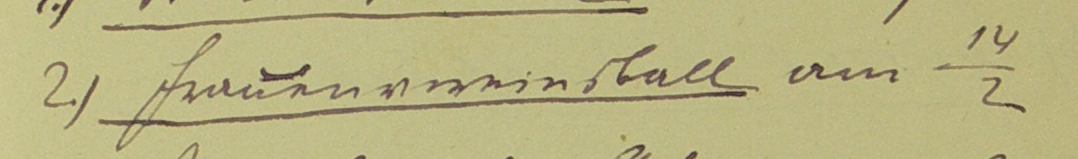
2.) Frauenvereinsball am 14/2
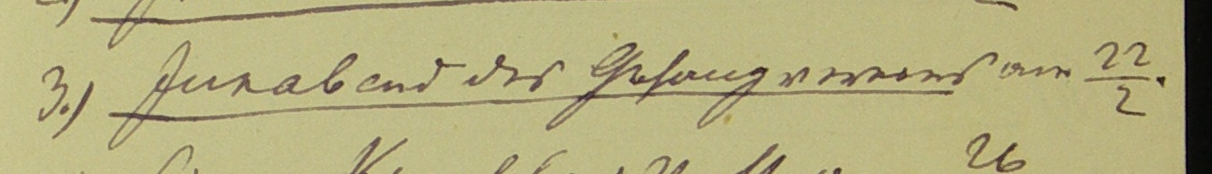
3.) Juraabend des Gesangvereins am 22/2
